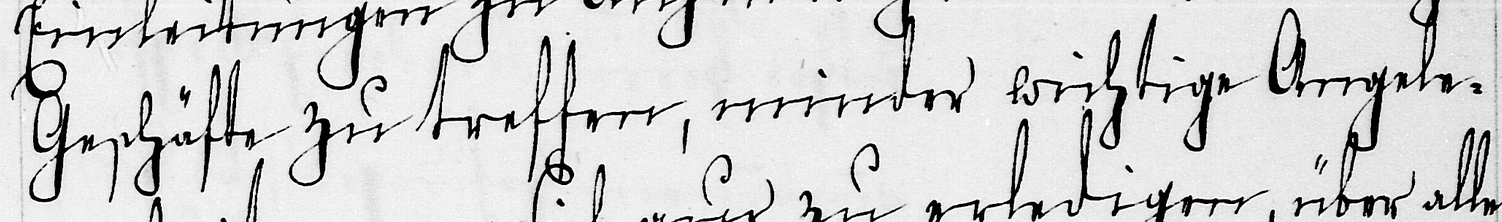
Geschäfte zu treffen, minder wichtige Angele¬
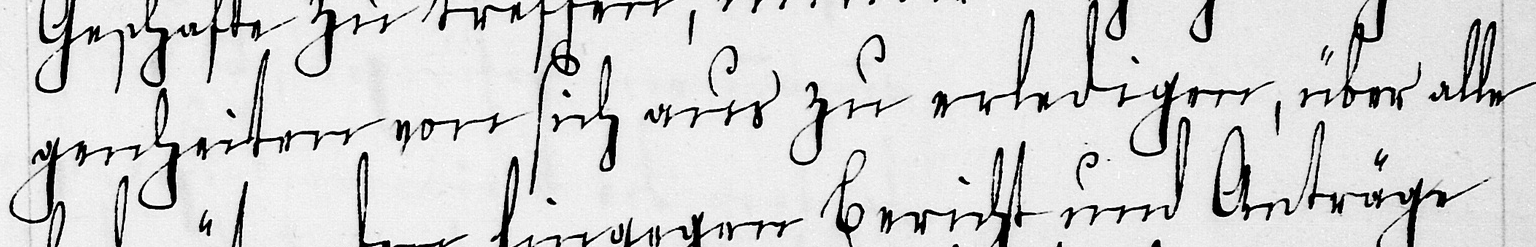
genheiten von sich aus zu erledigen, über alle
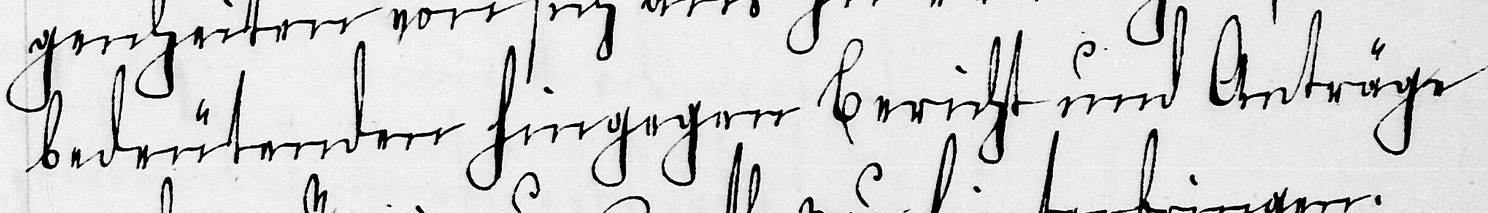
bedeutenden hingegen Bericht und Anträge
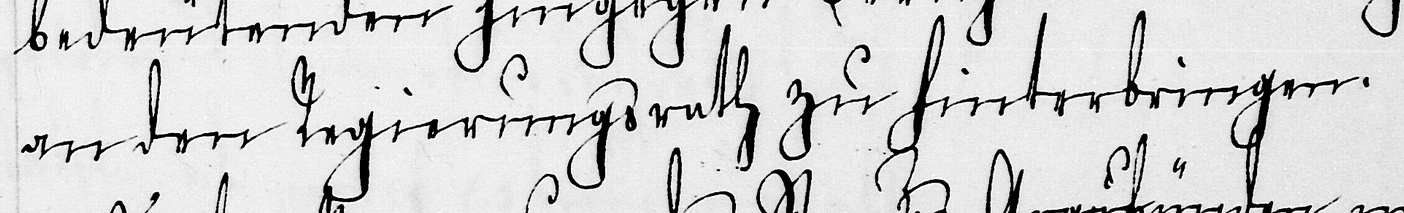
an den Regierungsrath zu hinterbringen.
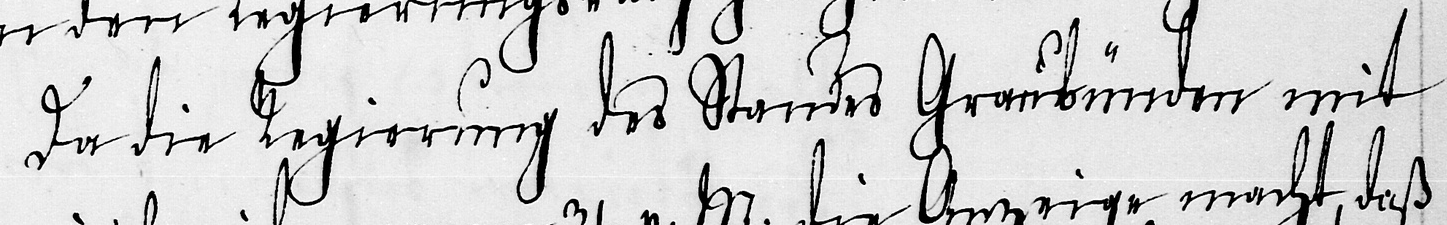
Da die Regierung des Standes Graubünden mit
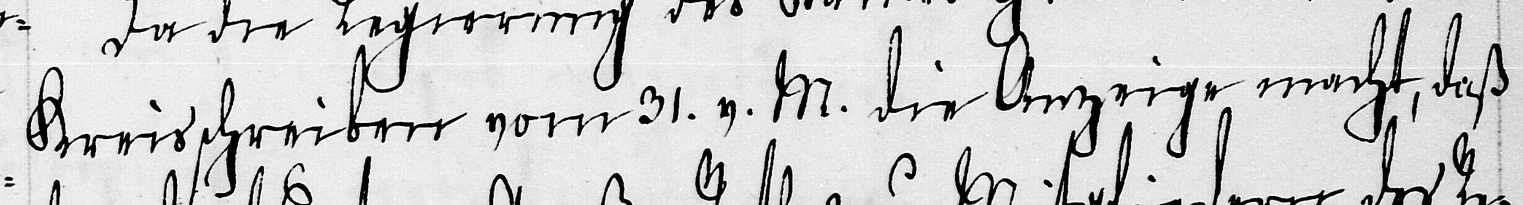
Kreisschreiben vom 31. v. M. die Anzeige macht, daß
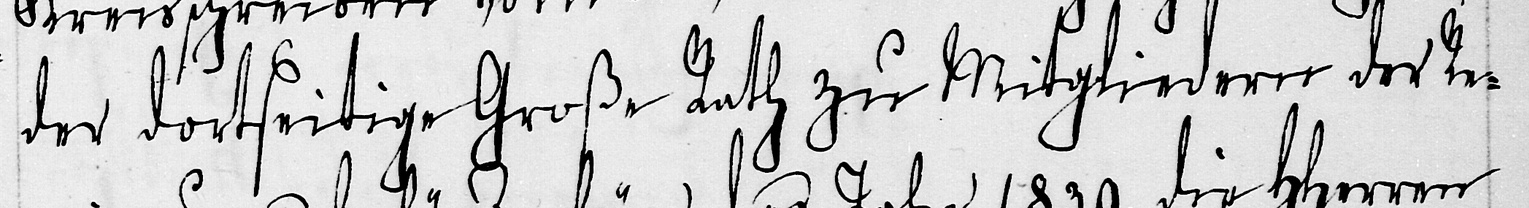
der dortseitige Große Rath zu Mitgliedern der Re¬
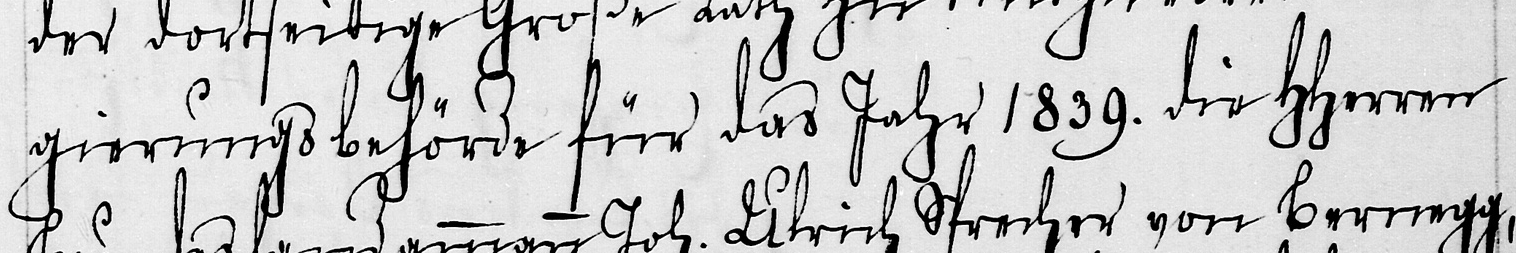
gierungsbehörde für das Jahr 1839. die HHerren
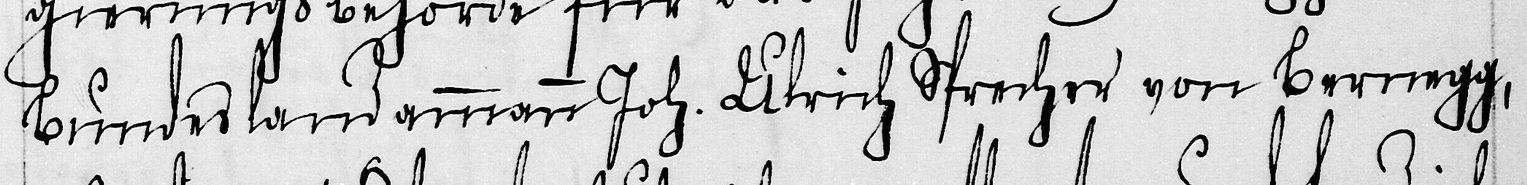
Bundeslandammann Joh. Ulrich Sprecher von Bernegg,
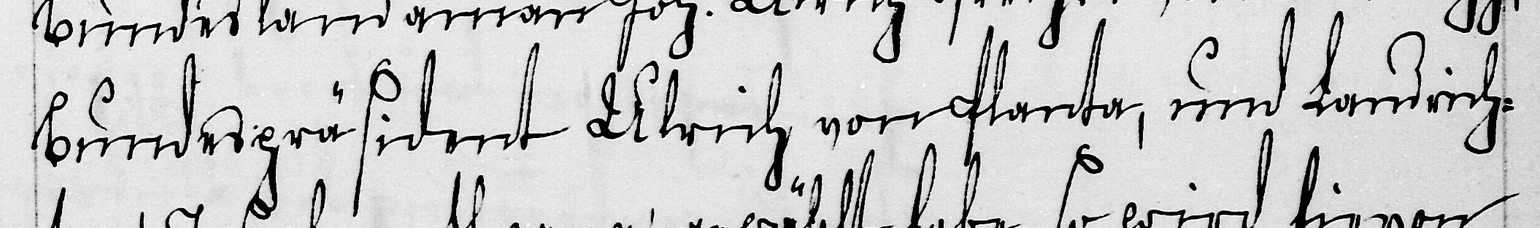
Bundespräsident Ulrich von Planta, und Landrich¬
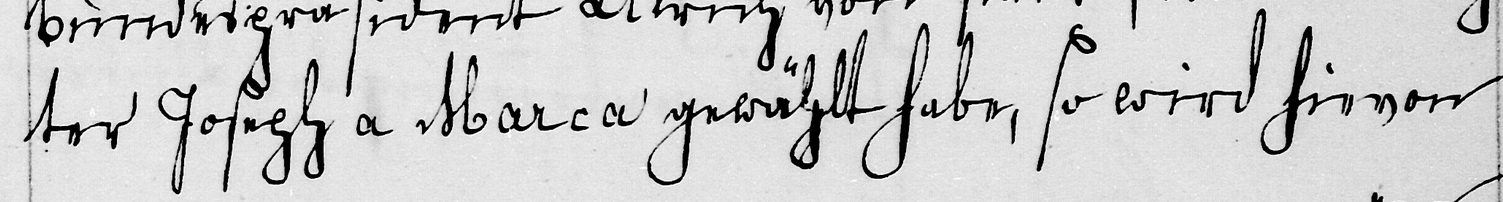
ter Joseph a Marca gewählt habe, so wird hievon
